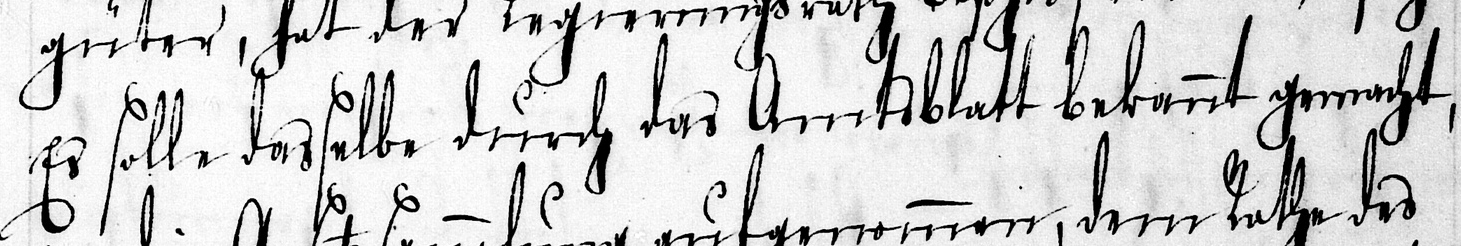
solle dasselbe durch das Amtsblatt bekannt gemacht,
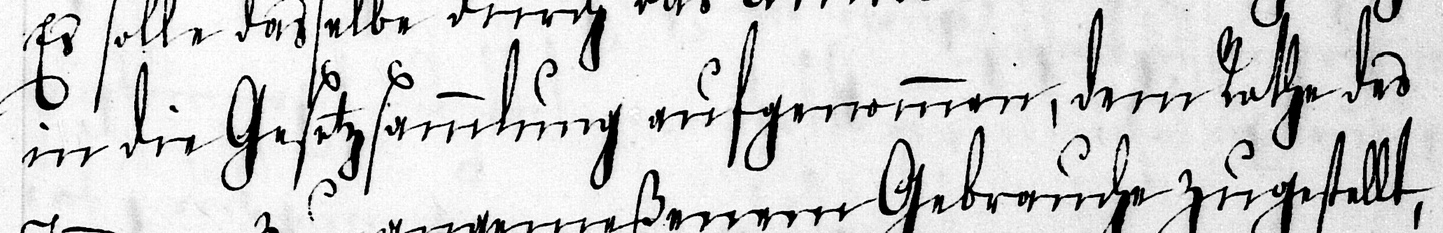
in die Gesetzsammlung aufgenommen, dem Rathe des
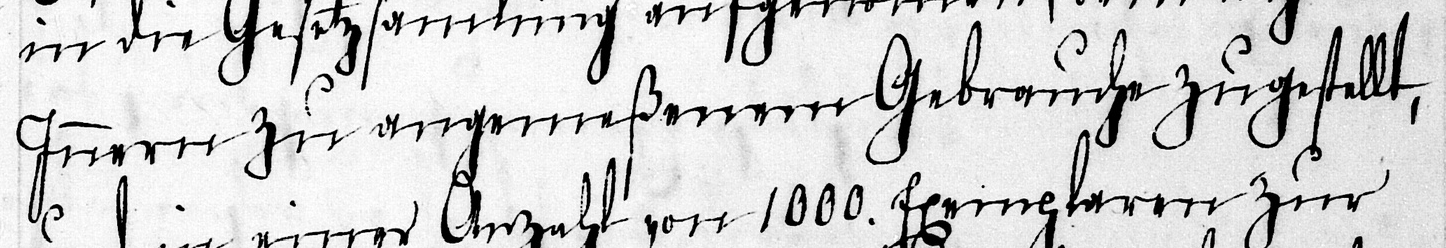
Innern zu angemeßenem Gebrauche zugestellt,
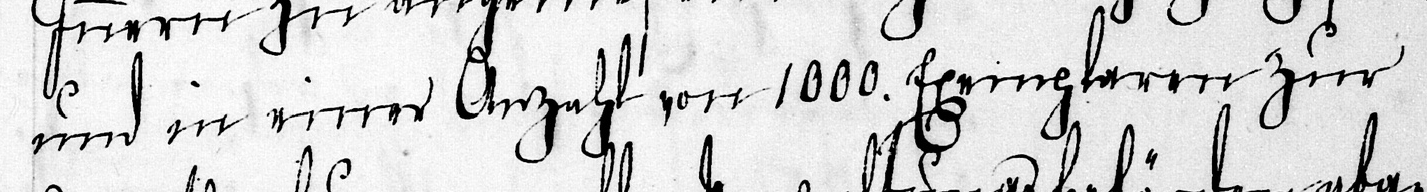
und in einer Anzahl von 1000. Exemplaren zur
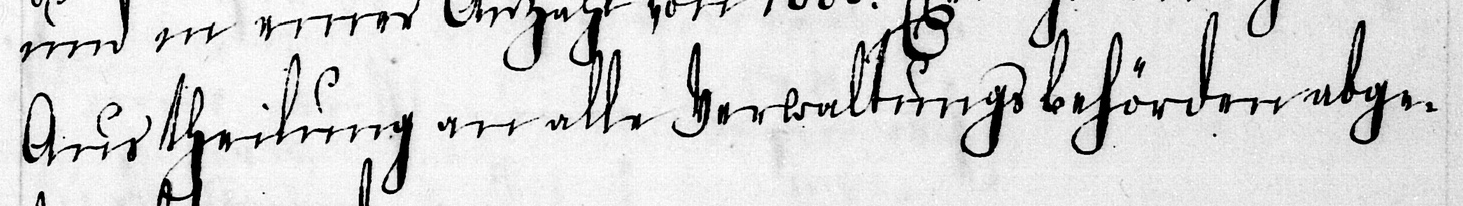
Austheilung an alle Verwaltungsbehörden abge¬
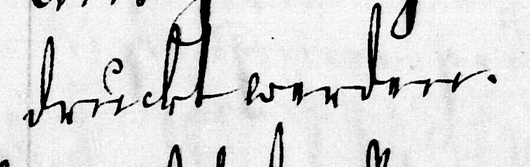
druckt werden.
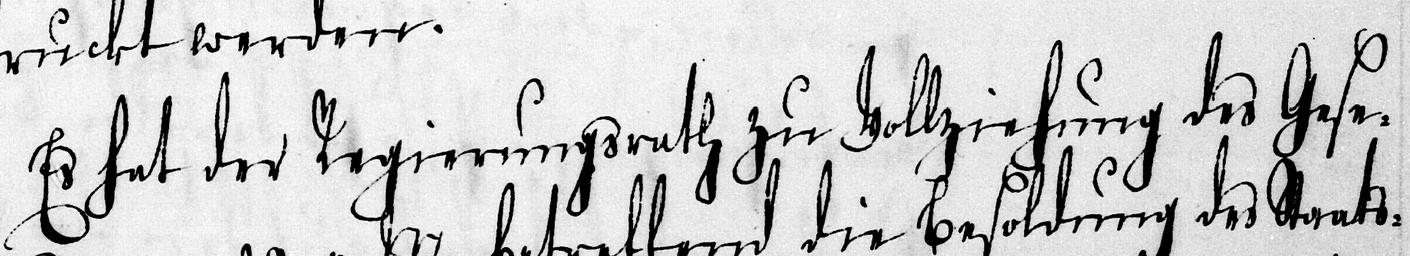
Es hat der Regierungsrath zu Vollziehung des Gese¬
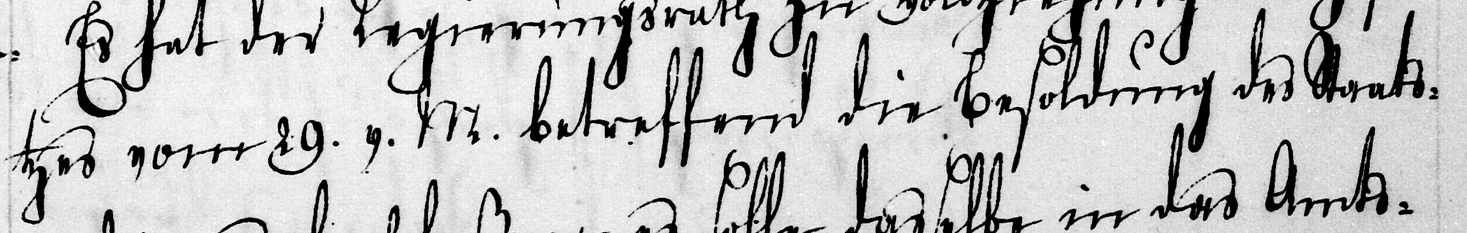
tzes vom 29. v. M. betreffend die Besoldung des Staats¬
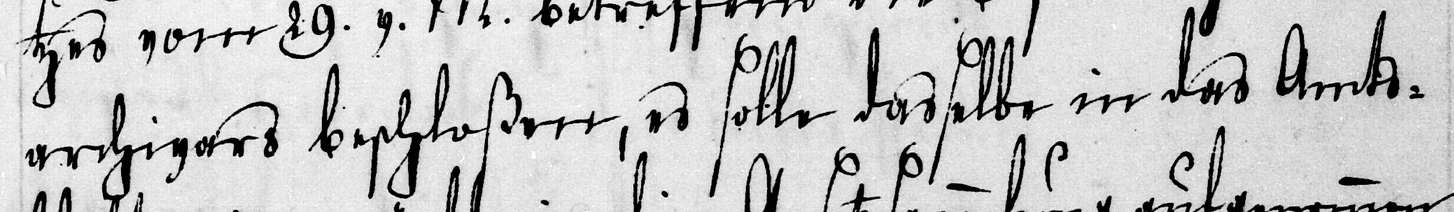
archivars beschloßen, es solle dasselbe in das Amts¬
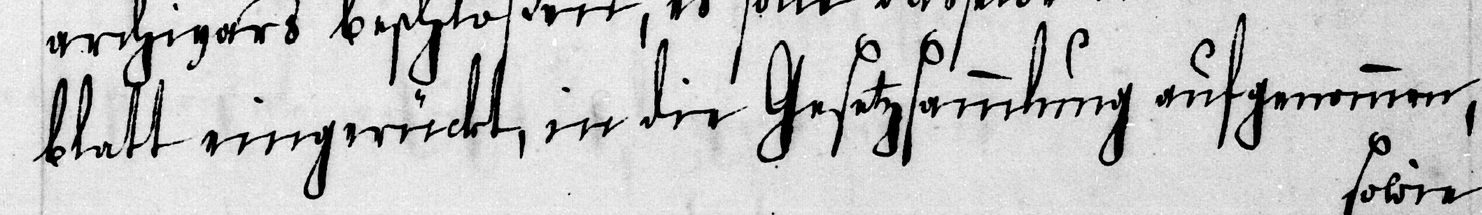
blatt eingerückt, in die Gesetzsammlung aufgenommen,
